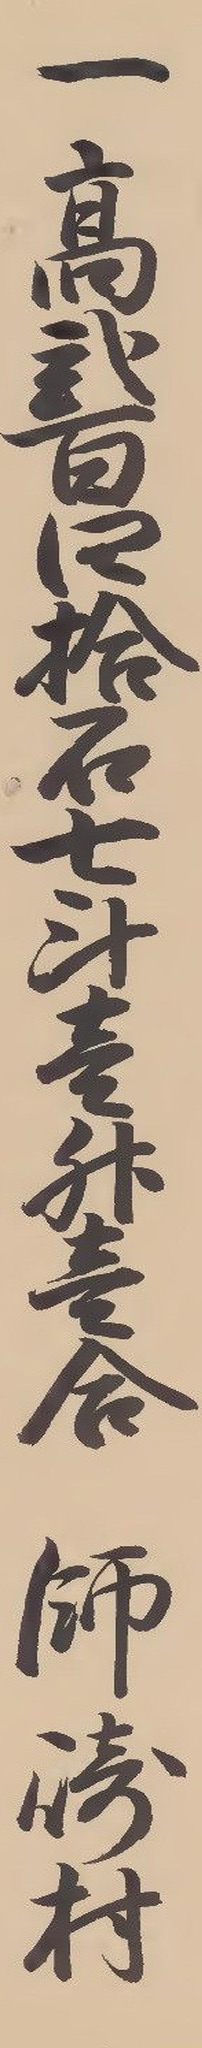一高弐百四拾石七斗壱升壱合師崎村
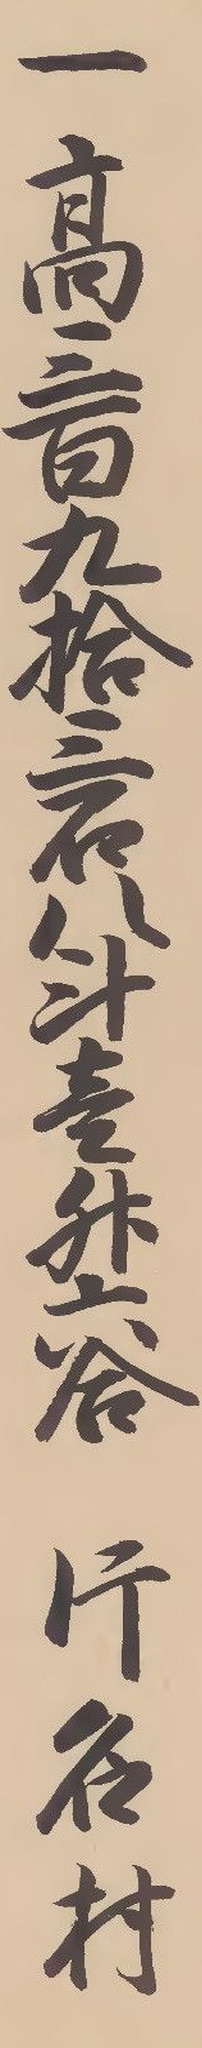一高三百九拾三石八斗壱升六合片名村
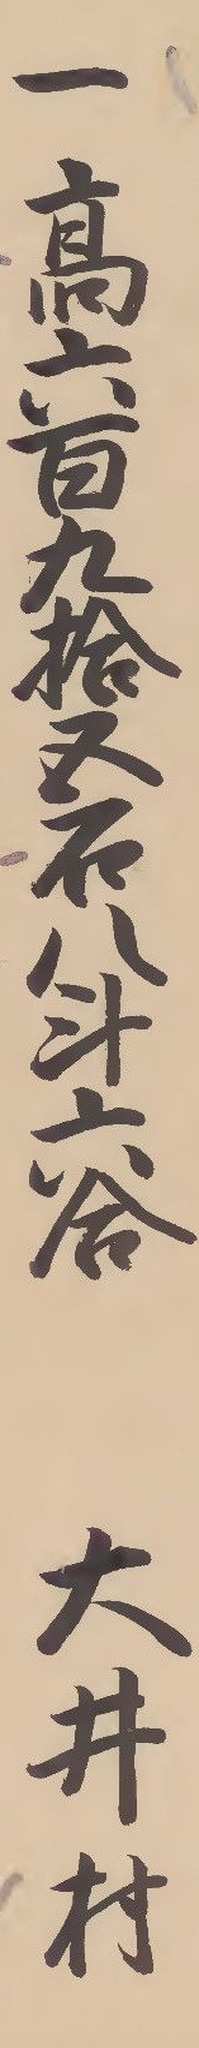一高六百九拾五石八斗六合大井村

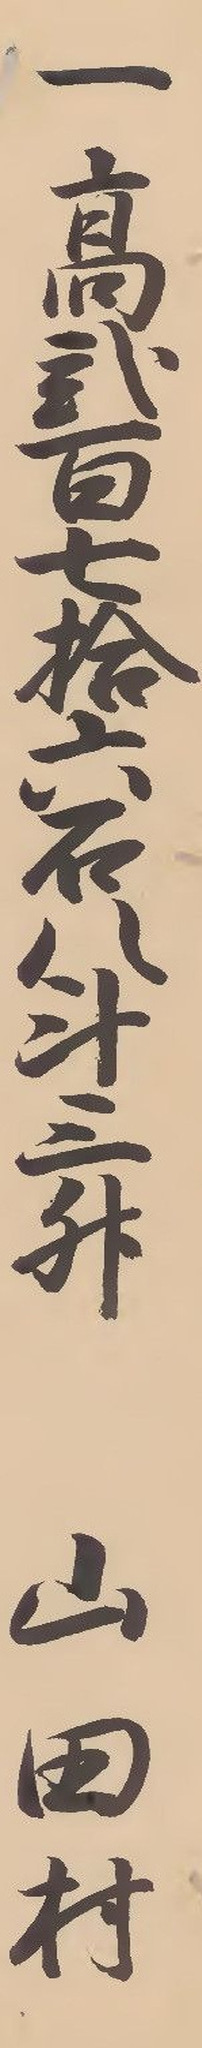一高弐百七拾六石八斗三升山田村
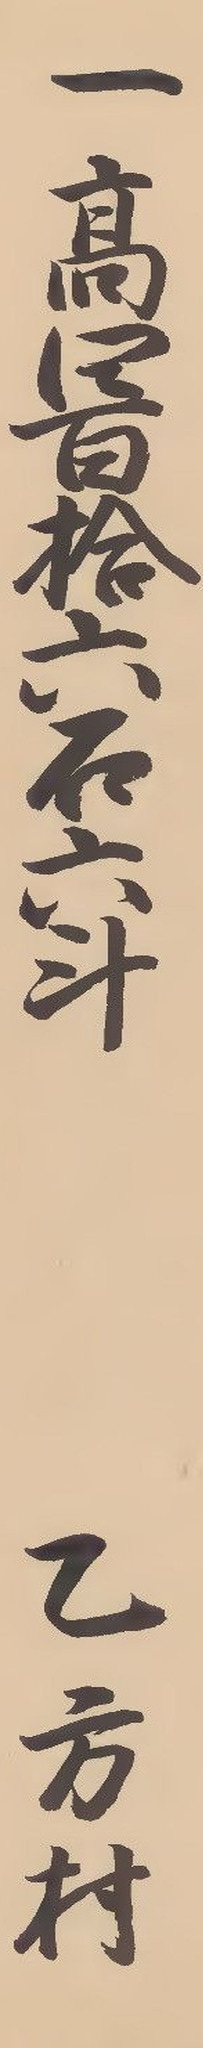一高四百拾六石六斗乙方村
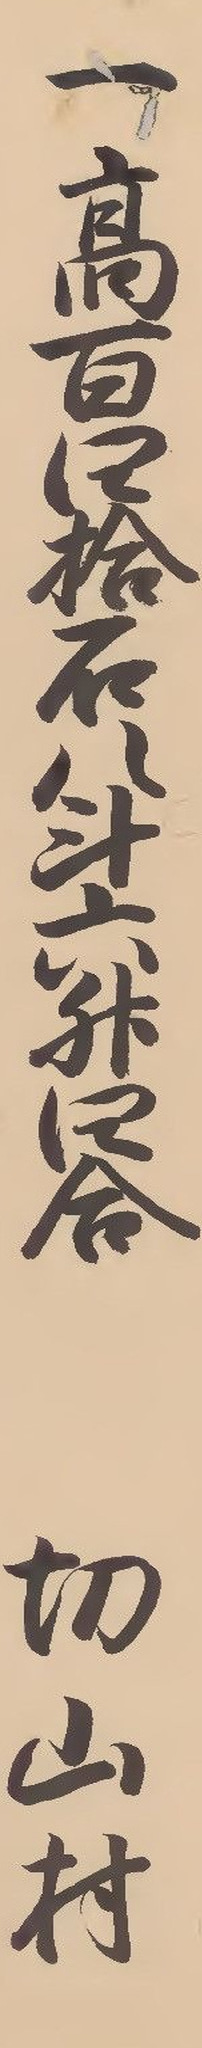一高百四拾石八斗六升四合切山村
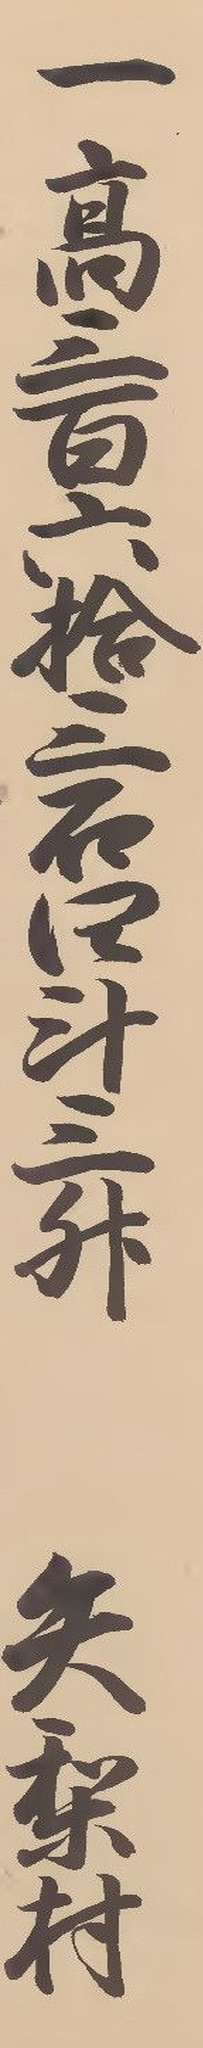一高三百六拾三石四斗三升矢梨村
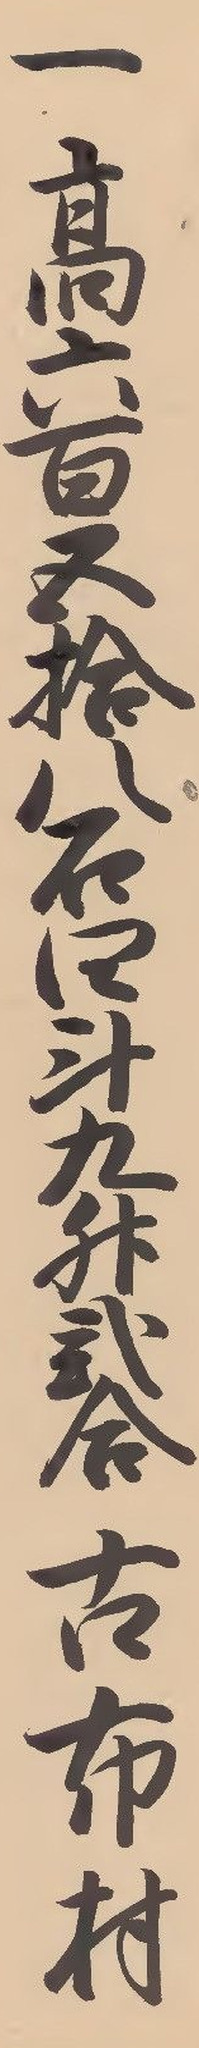一高六百五拾八石四斗九升弐合古布村
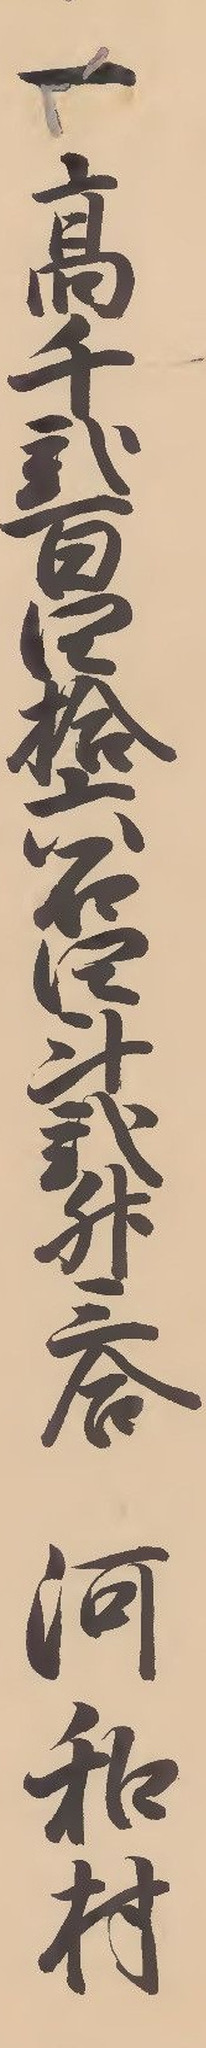一高千弐百四拾六石四斗弐升三合河和村
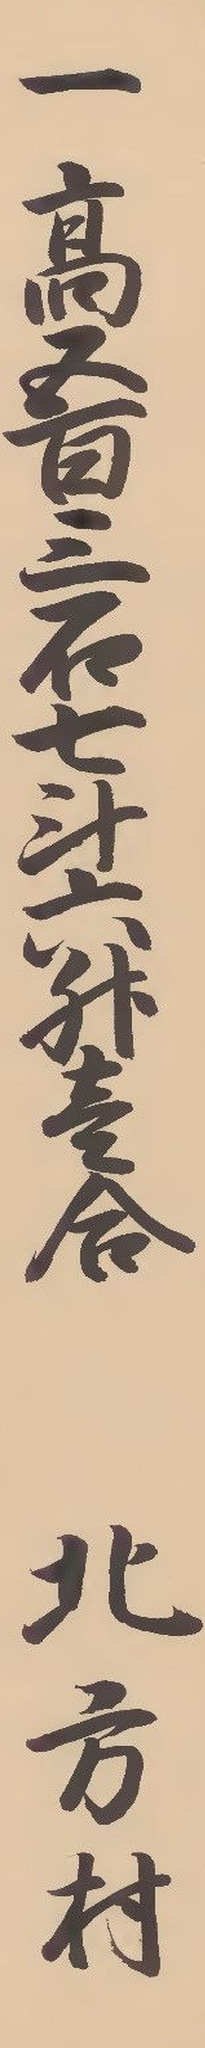一高五百三石七斗六升壱合北方村

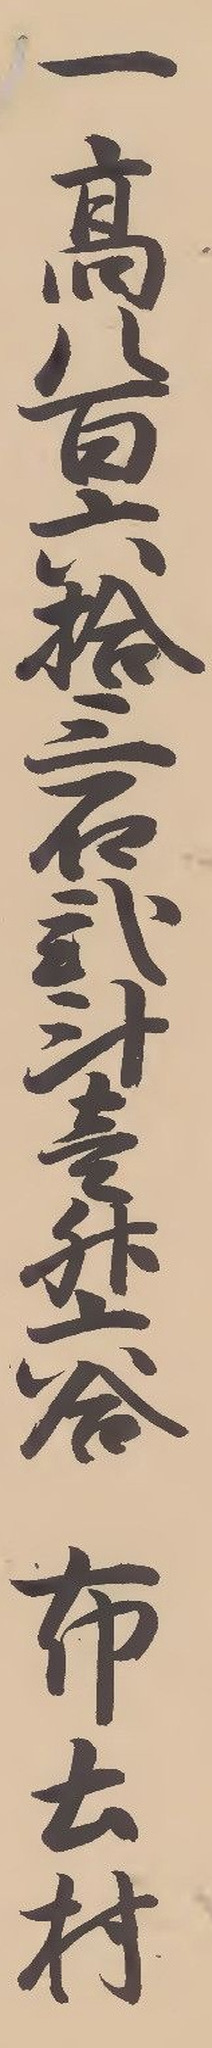一高八百六拾三石弐斗壱升六合布土村
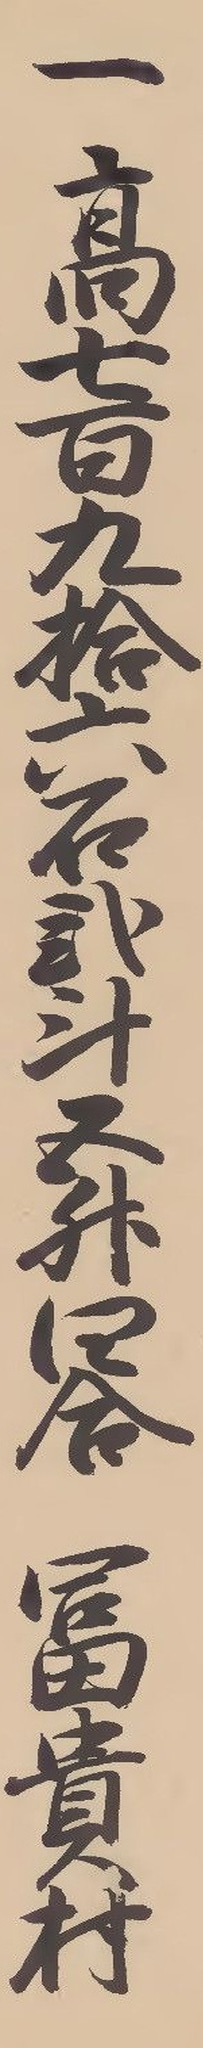一高七百九拾六石弐斗五升四合富貴村
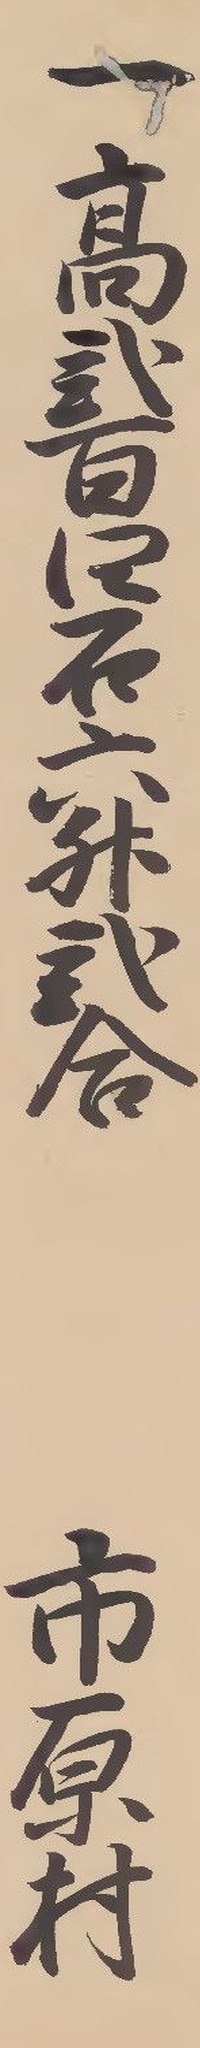一高弐百四石六升弐合市原村
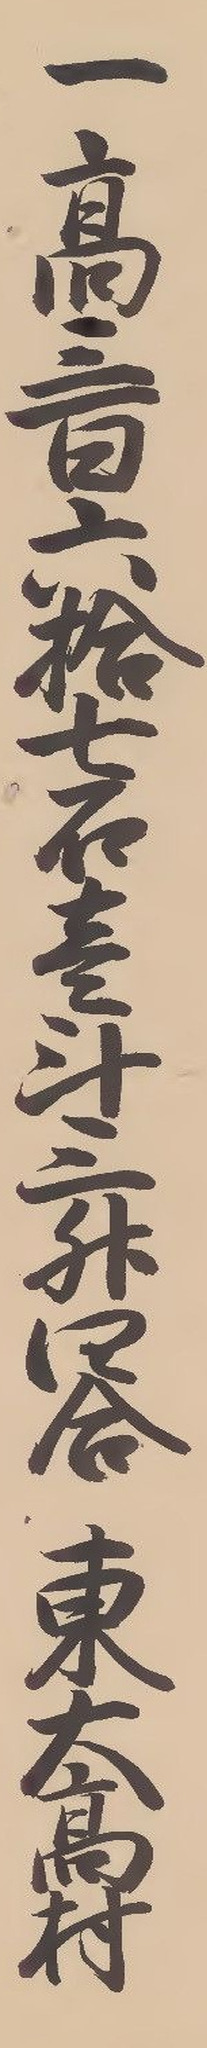一高三百六拾七石壱斗三升四合東大高村
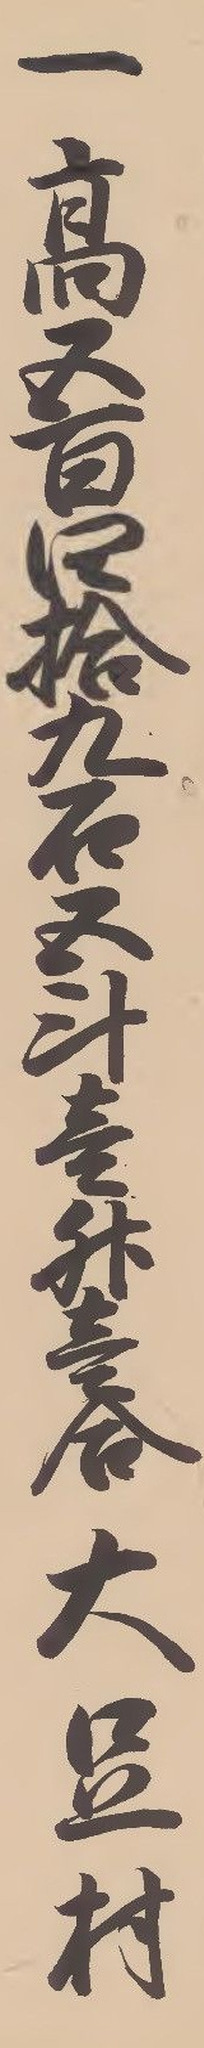一高五百四拾九石五斗壱升壱合大足村
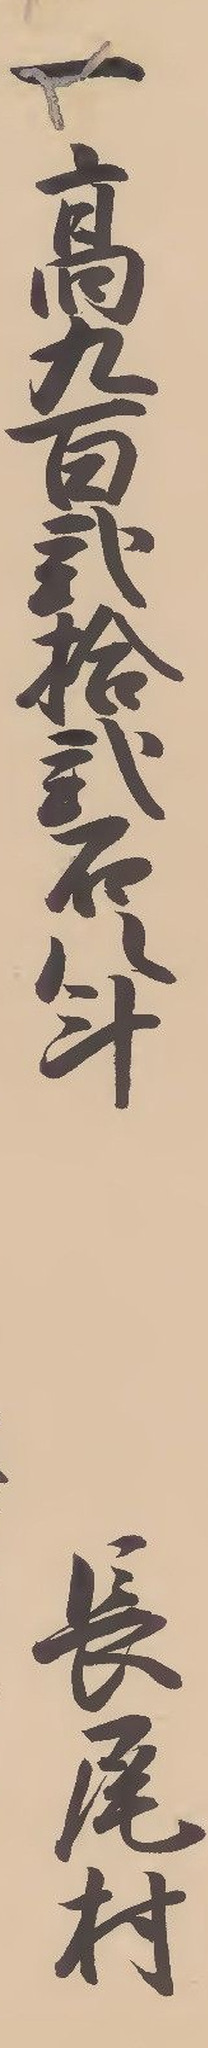一高九百弐拾弐石八斗長尾村
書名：尾張国郷帳
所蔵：国立公文書館 National Archives of Japan
